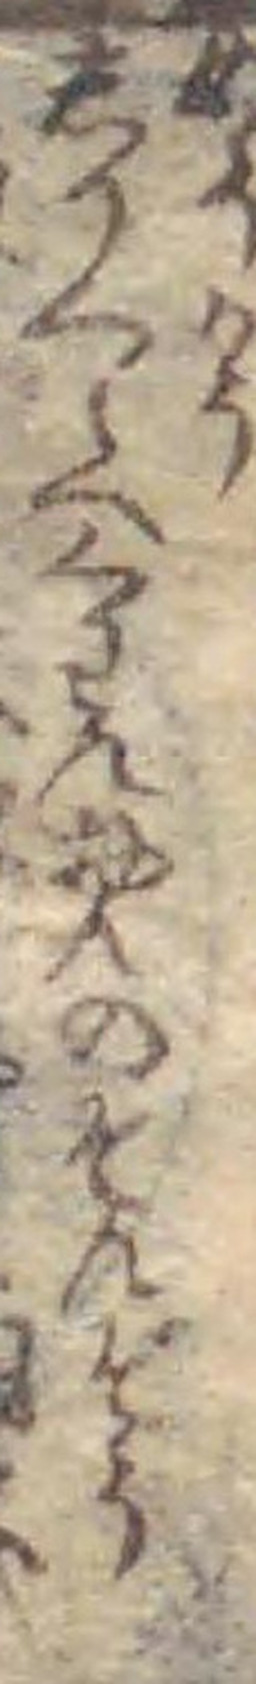しりくらへくわんおんのそんぞう
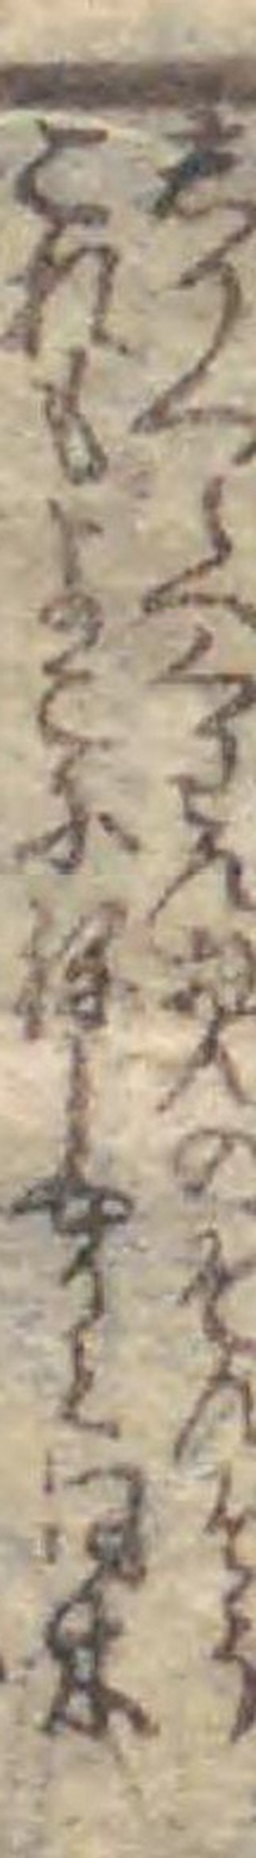これもよこにねしやかと同木
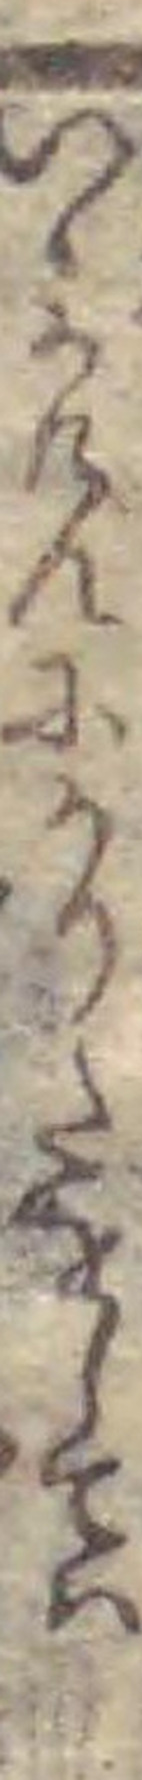いゝかけんにかりたをしては
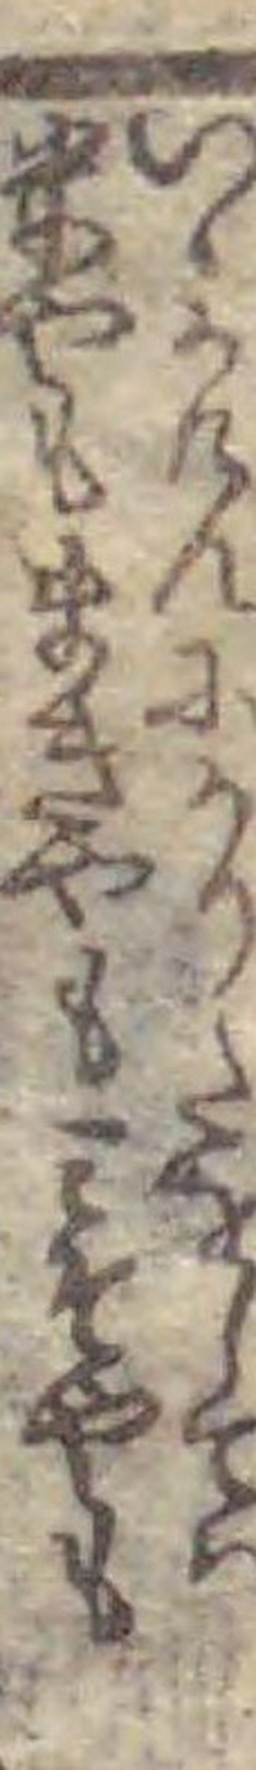米やもまきやもみそやも
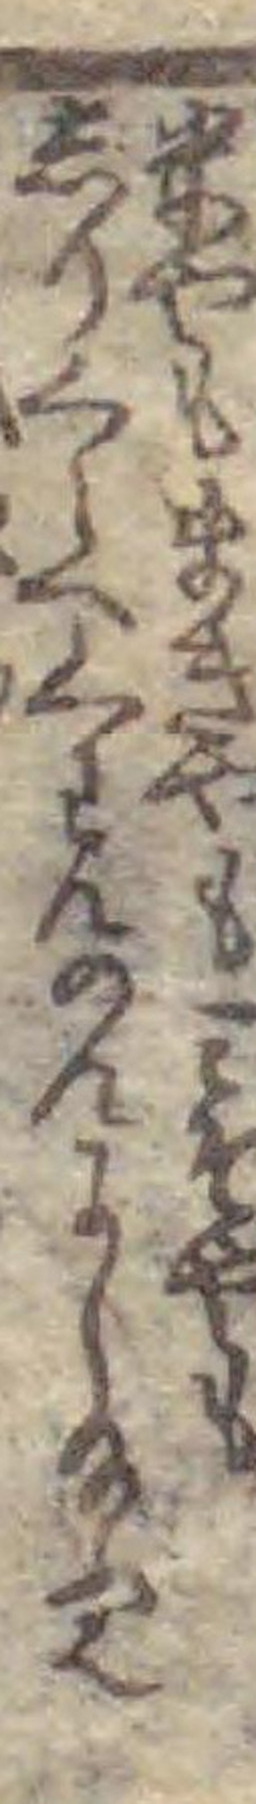しりくらへくわんのんにし給ふ也
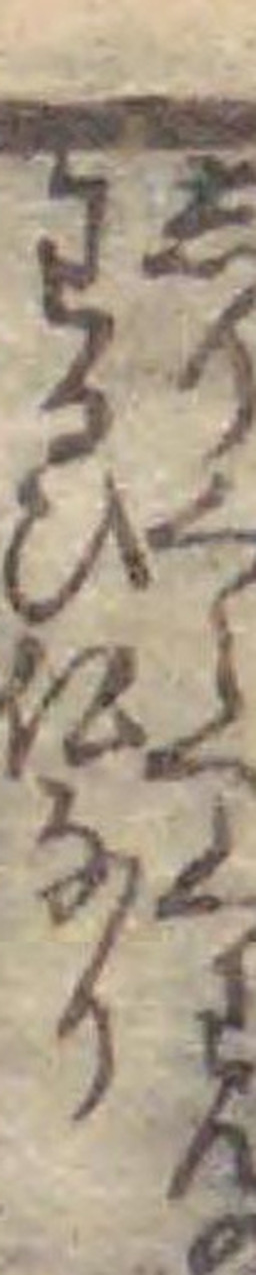わるひ仏なり
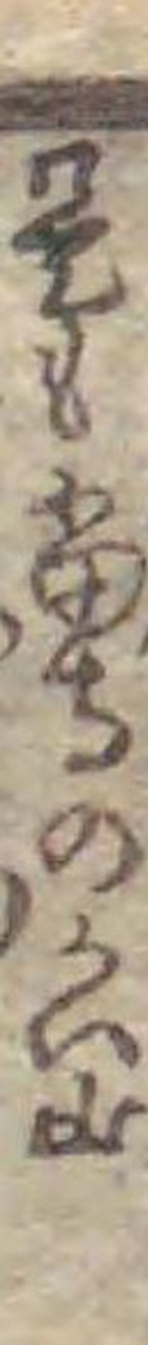是も当寺のかい山
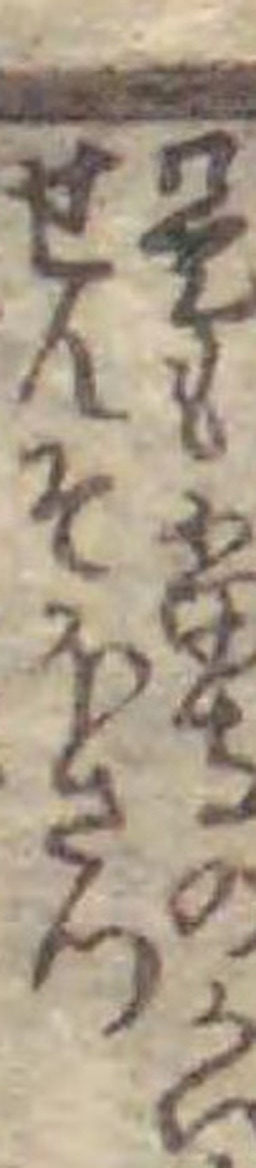せんそほさつ
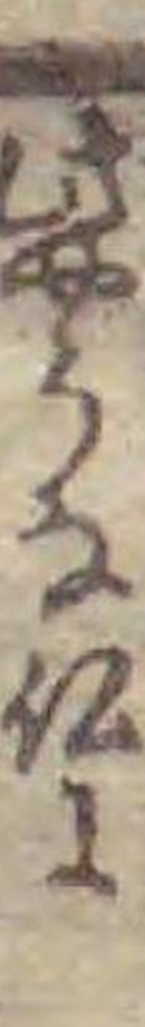此やうな仏に
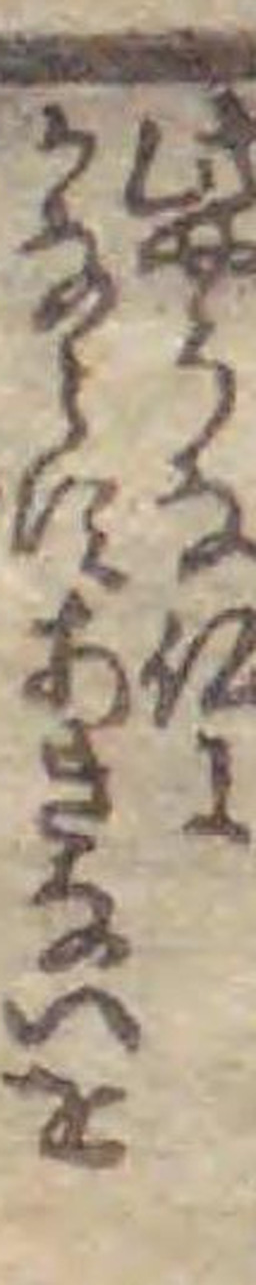かならすあきないを
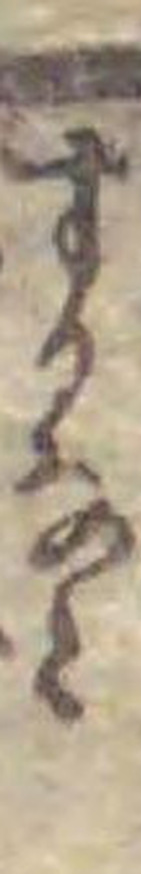するなと
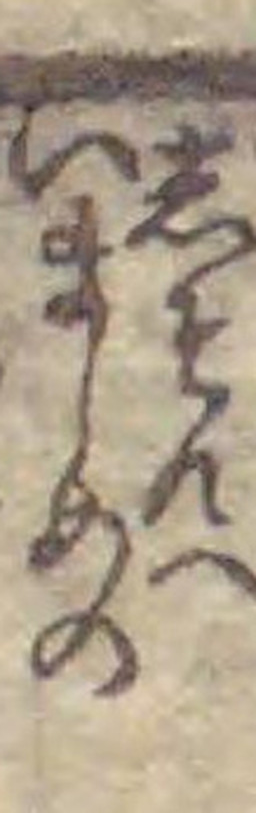いましめの
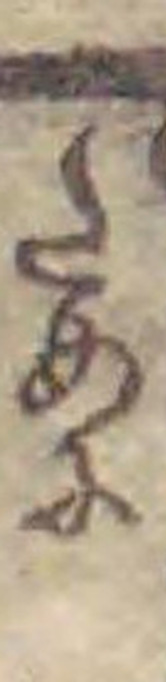ために
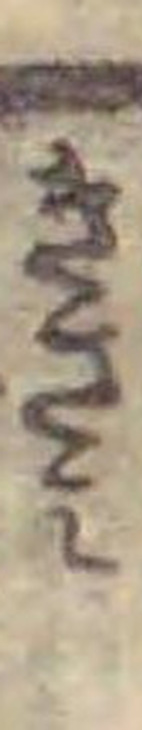きさみ

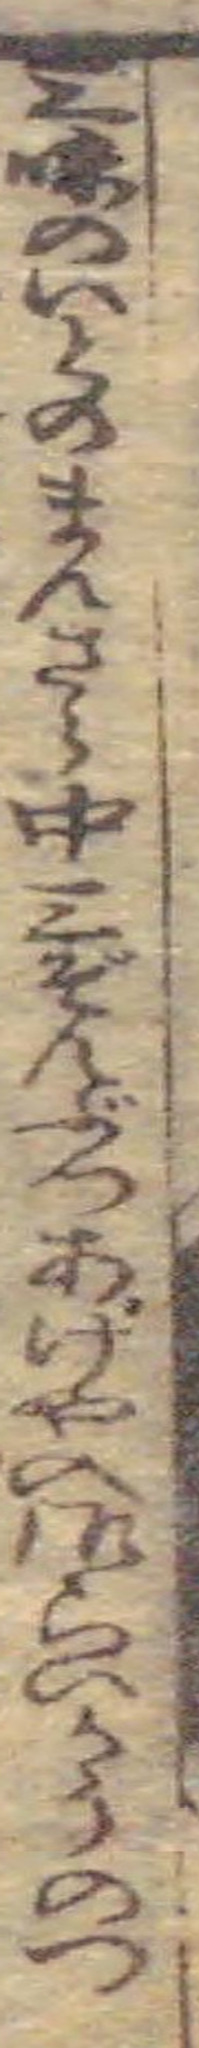三味のいとのまんさら中三ぞんぶつあげや入御らいかうのつ
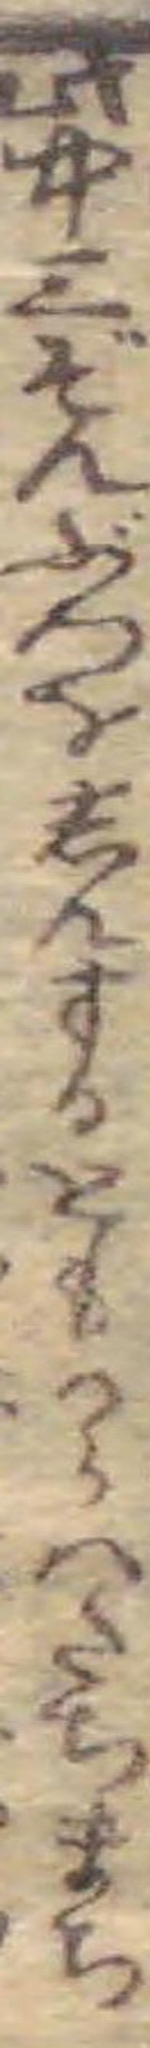此中三ぞんぶつをしんずるともからはたちまち
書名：身体開帳略縁起 : 3巻
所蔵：国立国会図書館 National Diet Library, JAPAN
